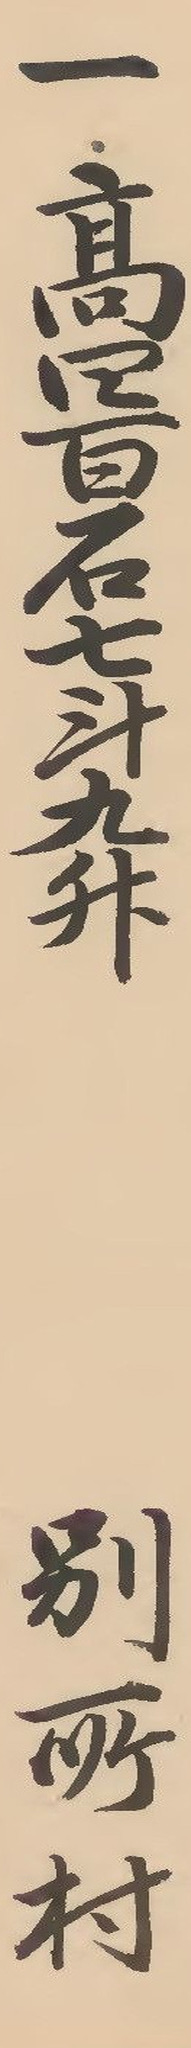一高四百石七斗九升別所村

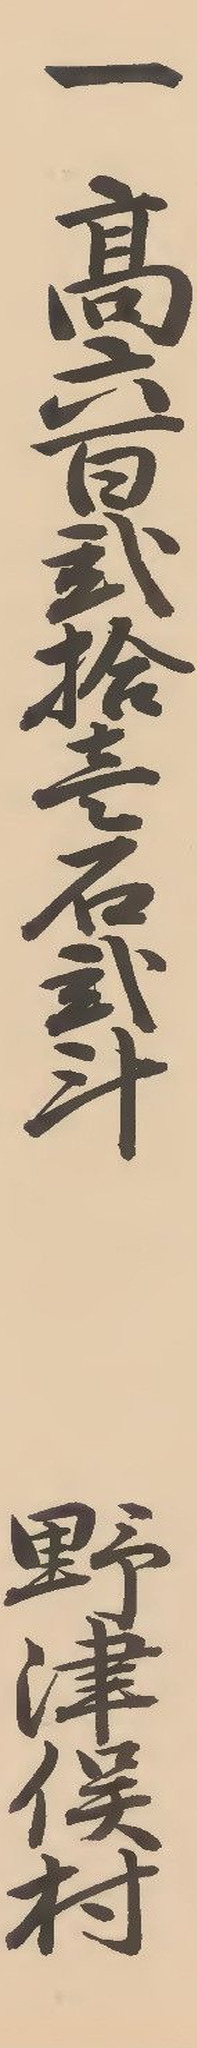一高六百弐拾壱石弐斗野津俣村
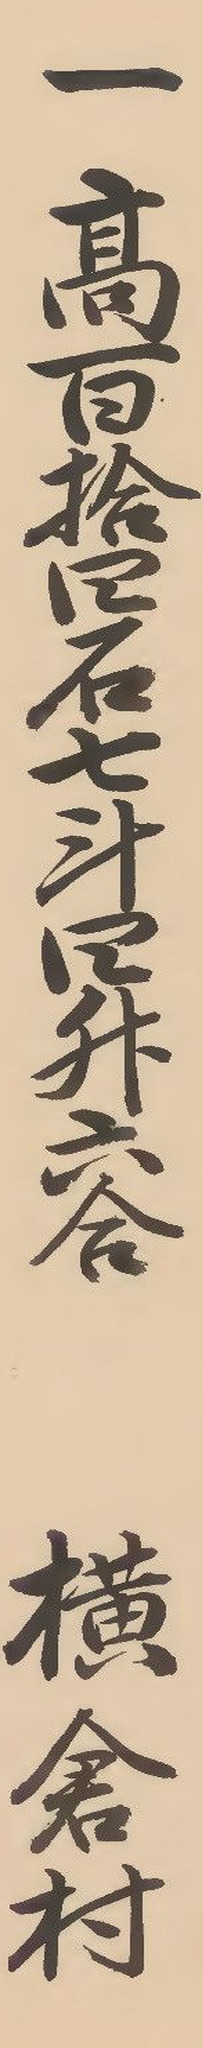一高百拾四石七斗四升六合横倉村
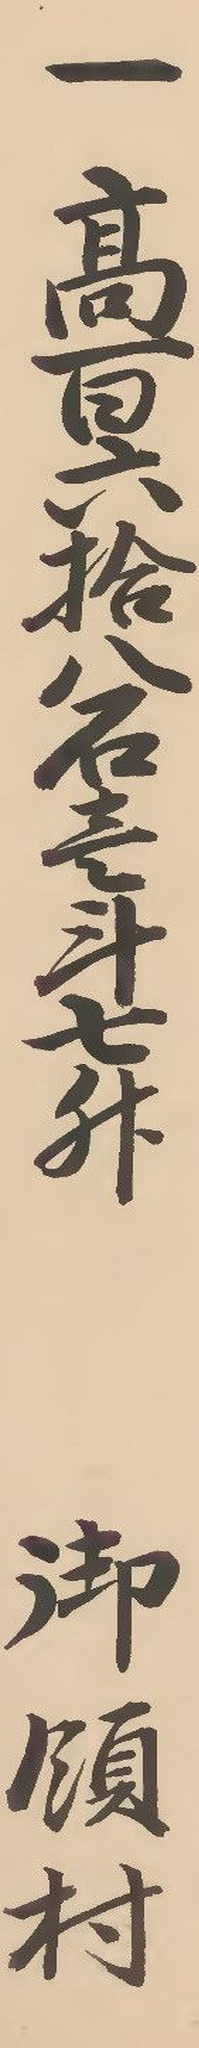一高百六拾八石壱斗七升御領村
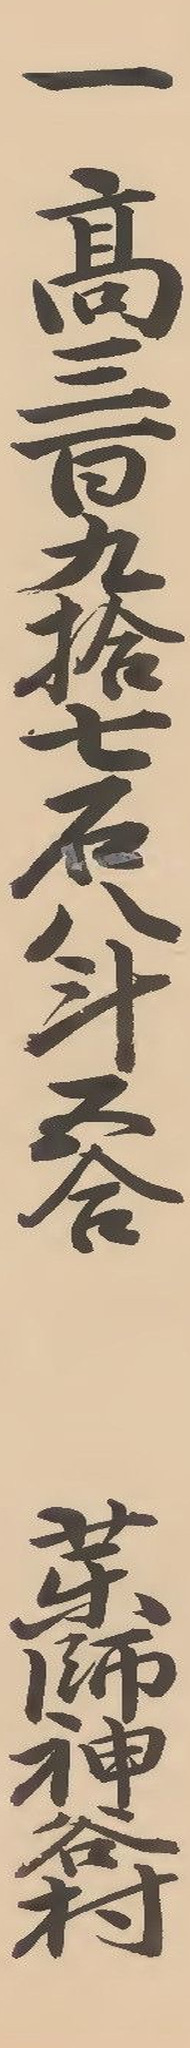一高三百九拾七石八斗五合薬師神谷村
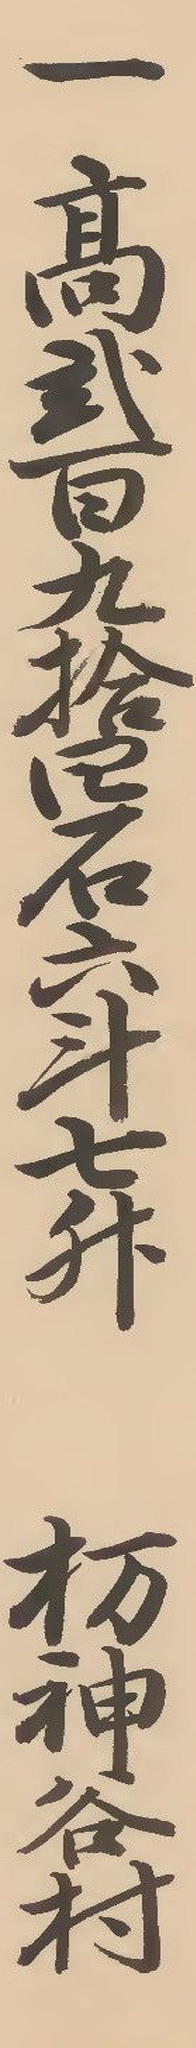一高弐百九拾四石六斗七升栃神谷村

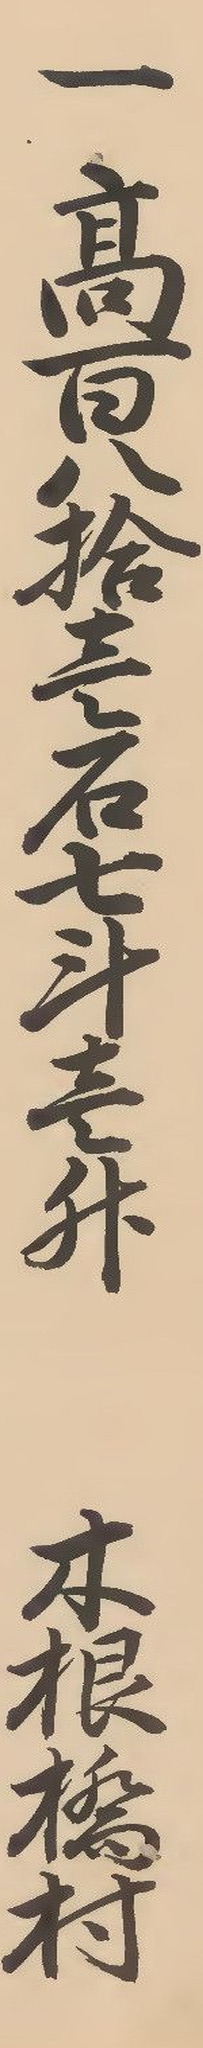一高百八拾壱石七斗壱升木根橋村
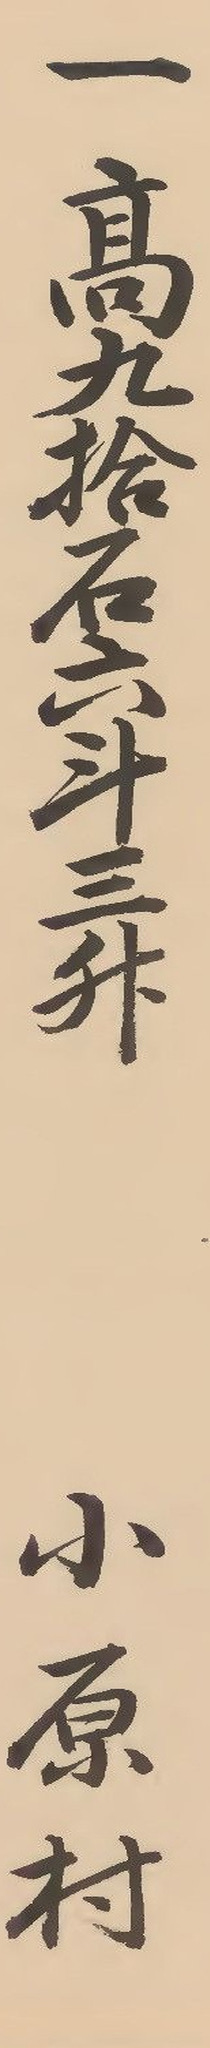一高九拾石六斗三升小原村
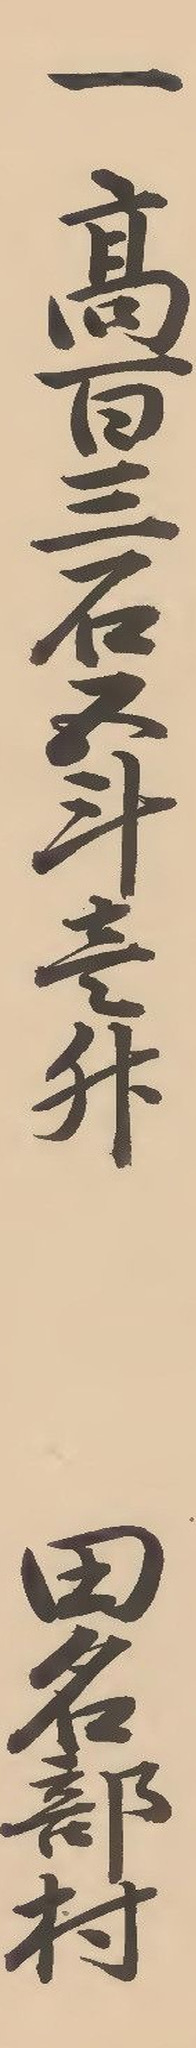一高百三石五斗壱升田名部村
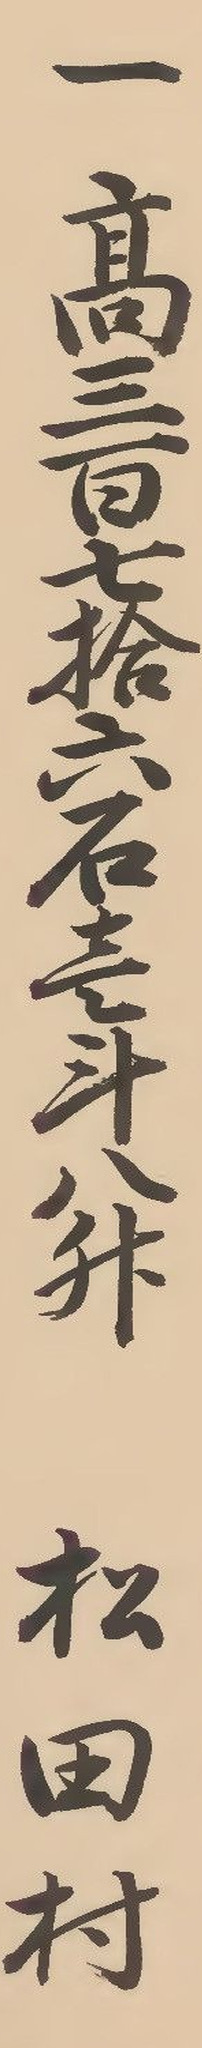一高三百七拾六石壱斗八升松田村
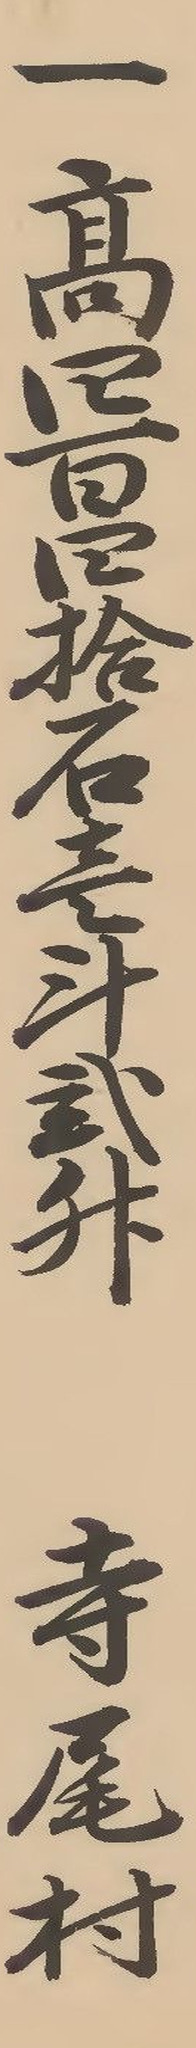一高四百四拾石壱斗弐升寺尾村
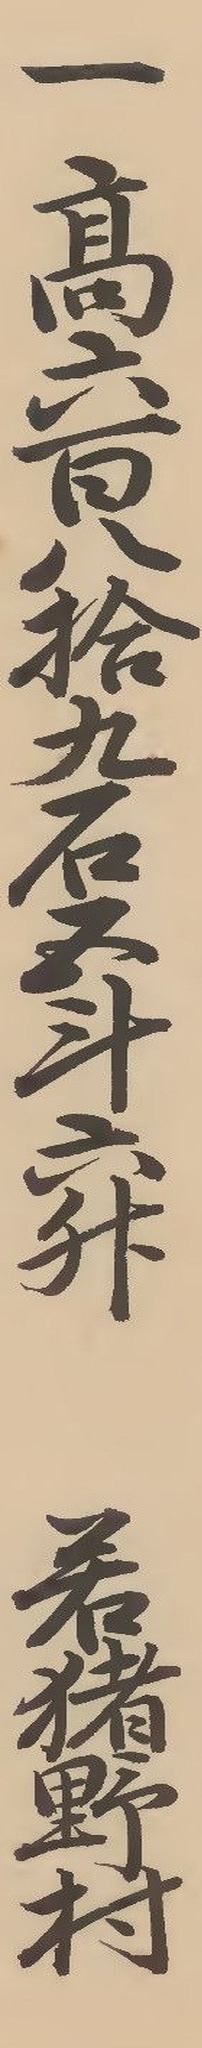一高六百八拾九石五斗六升若猪野村
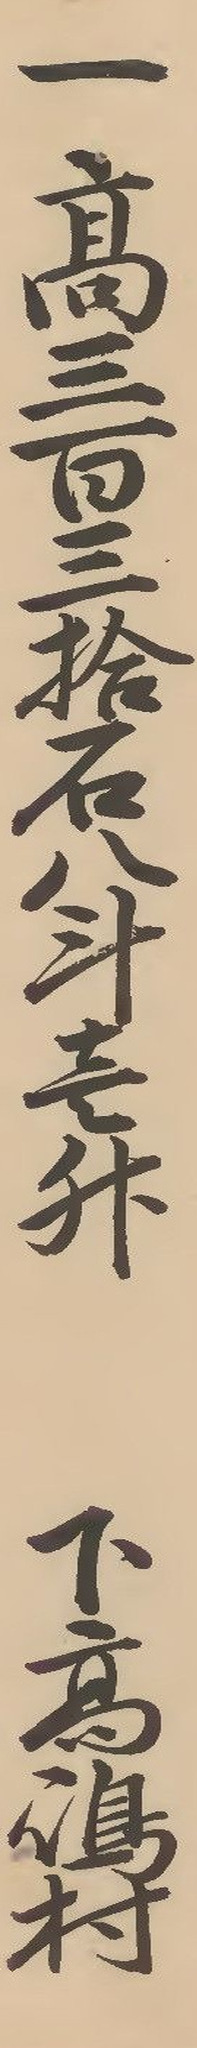一高三百三拾石八斗壱升下高島村

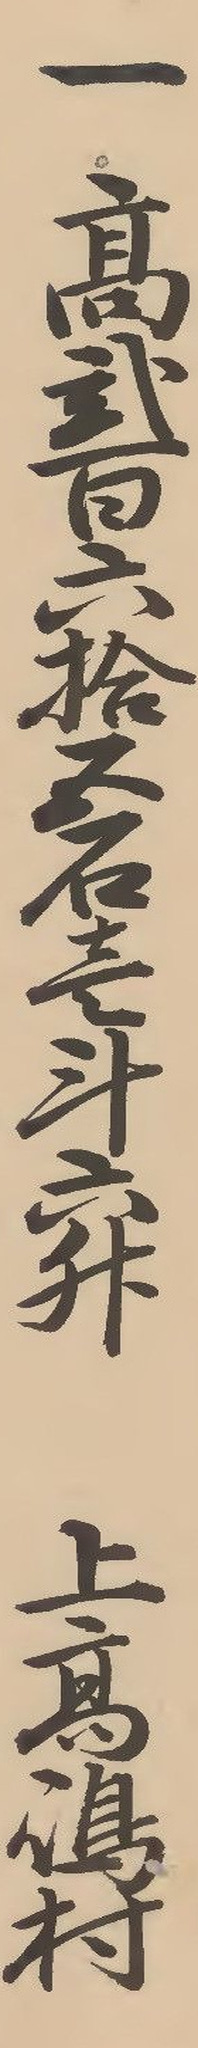一高弐百六拾五石壱斗六升上高島村
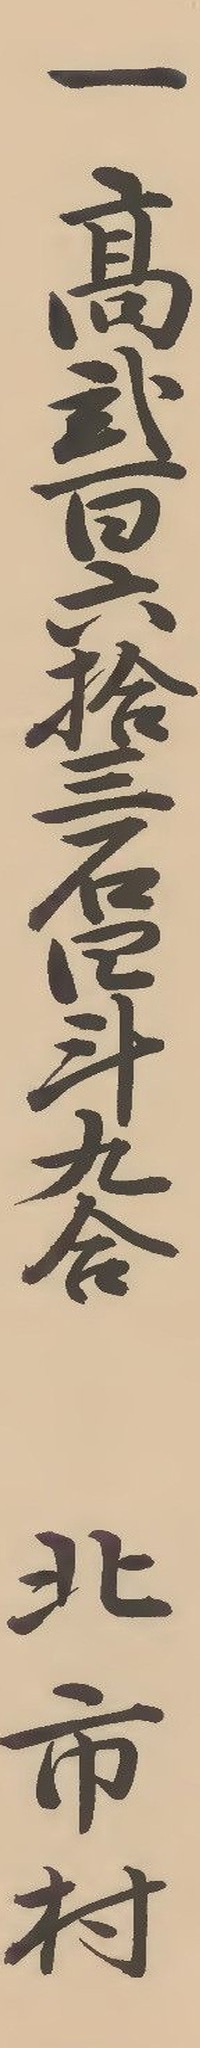一高弐百六拾三石四斗九合北市村
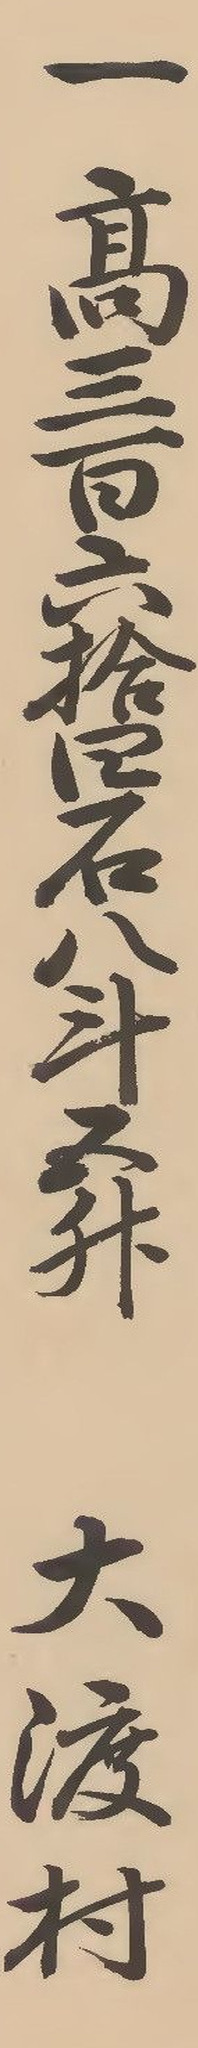一高三百六拾四石八斗五升大渡村
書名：越前国郷帳
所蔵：国立公文書館 National Archives of Japan
